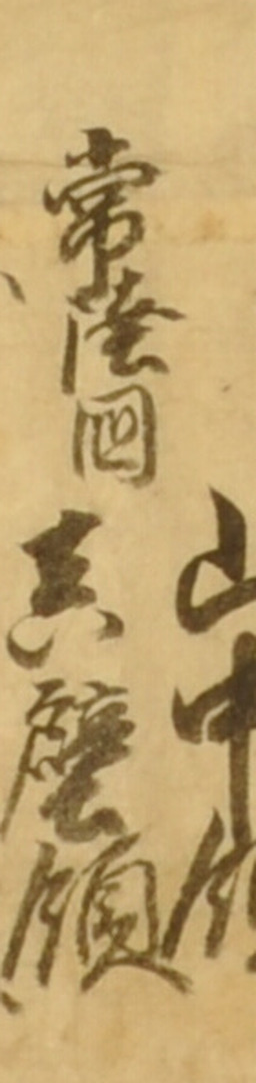常陸国真壁領
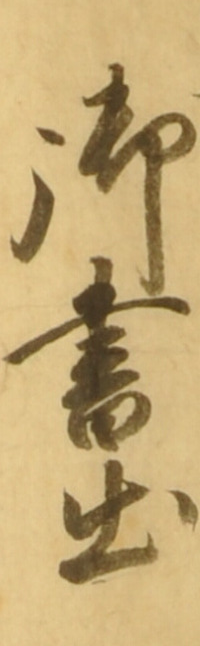御書出

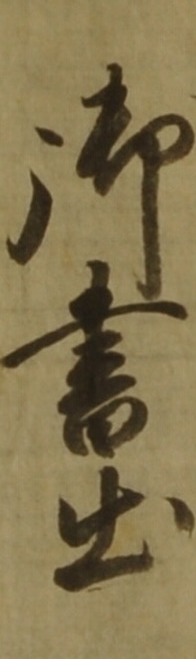御書出
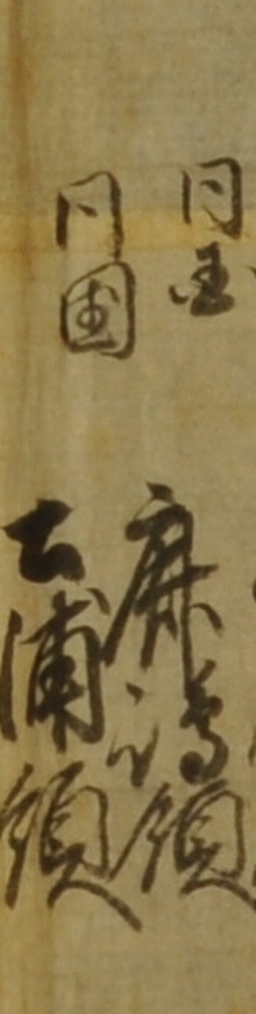同国土浦領
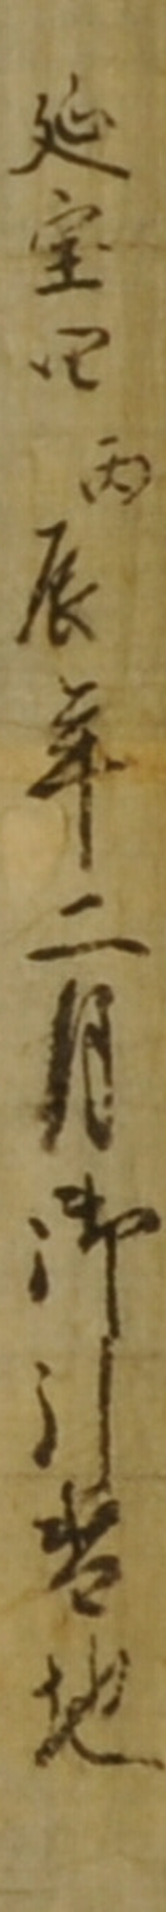延宝四丙辰年二月御引替地
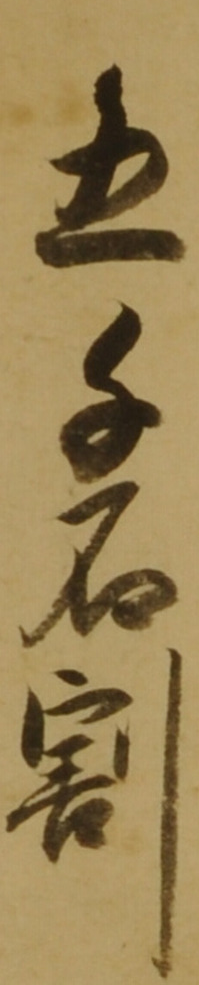五千石割

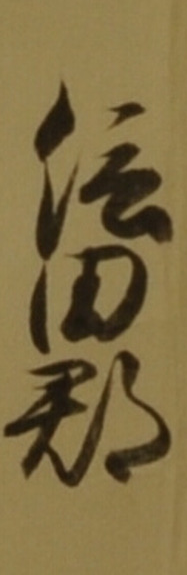信田群
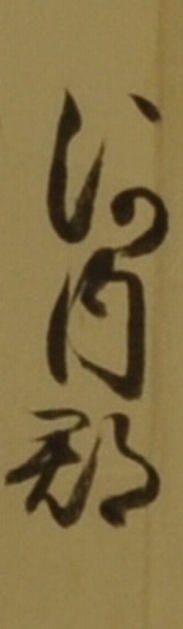河内郡
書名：御書出
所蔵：伊那市立高遠町図書館・合同会社AMANE
